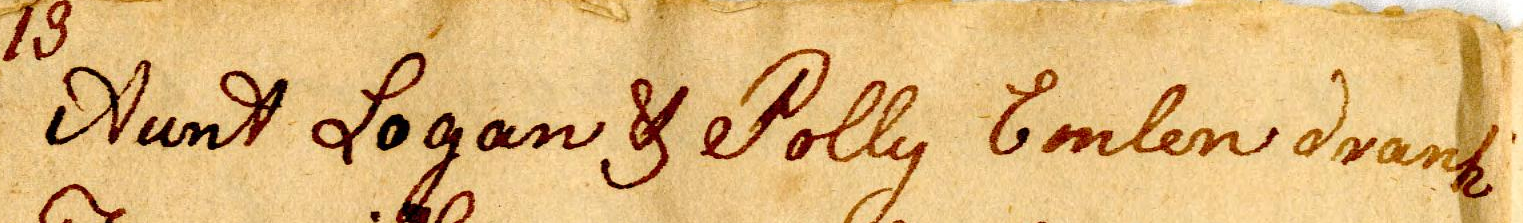Aunt Logan & Polly Emlen drank
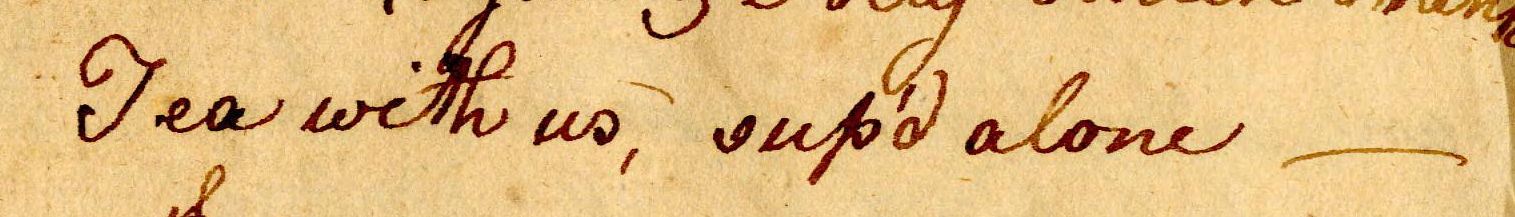Tea with us, sup'd alone-
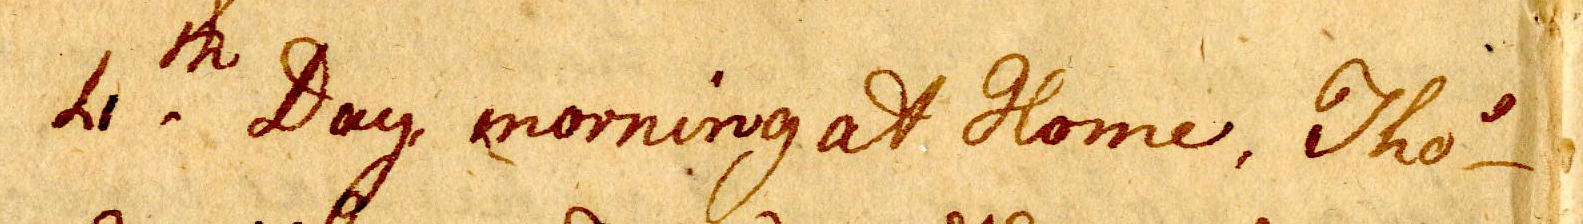4^th Day, morning at Home, Tho^s
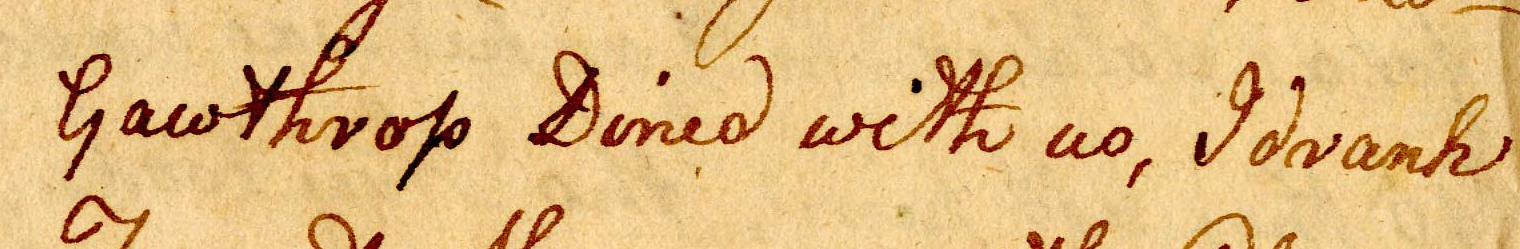Gawthrop Dined with us, I drank
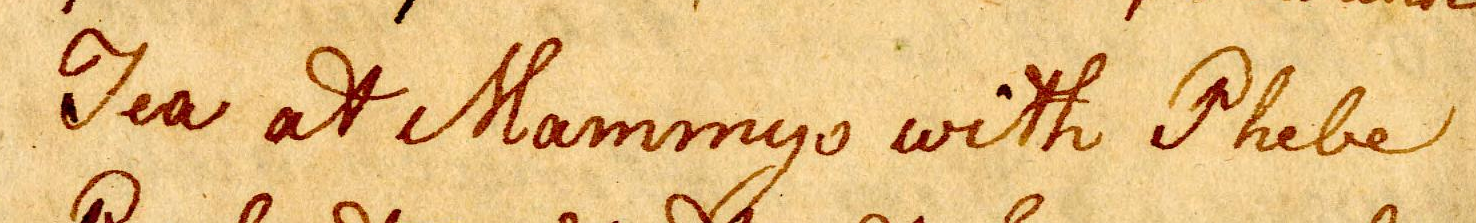Tea at Mammys with Phebe
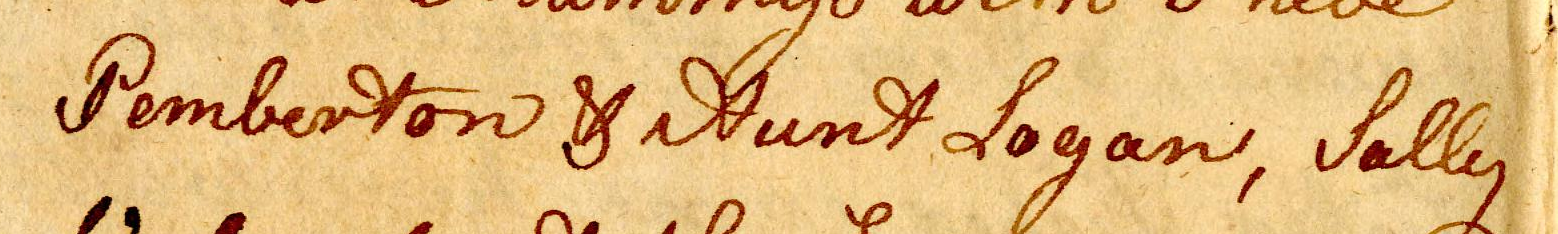Pemberton & Aunt Logan, Sally
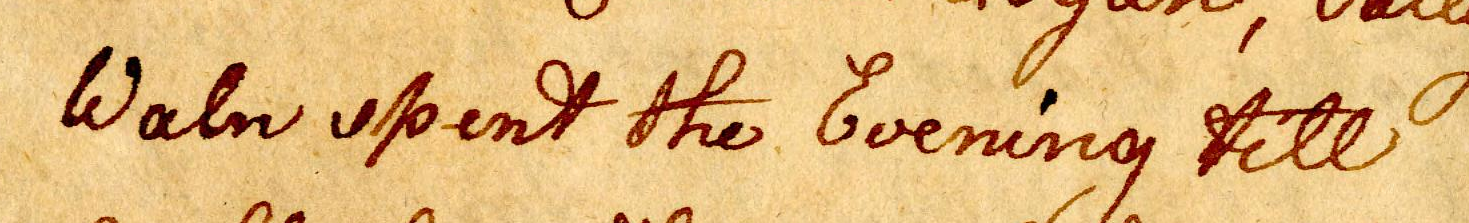Waln spent the Evening till
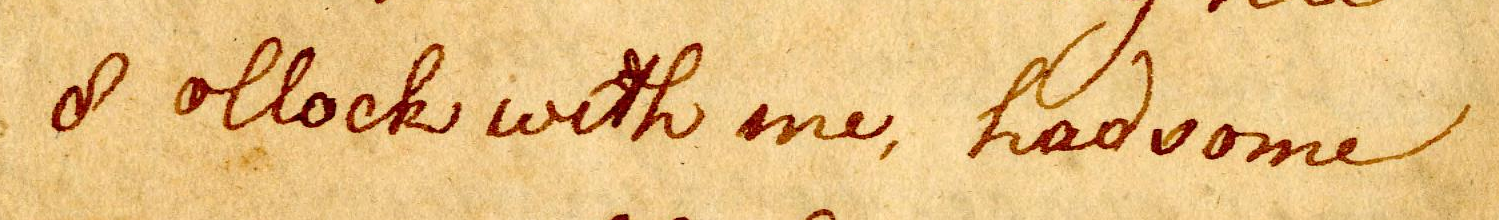8 ^oClock with me, had some
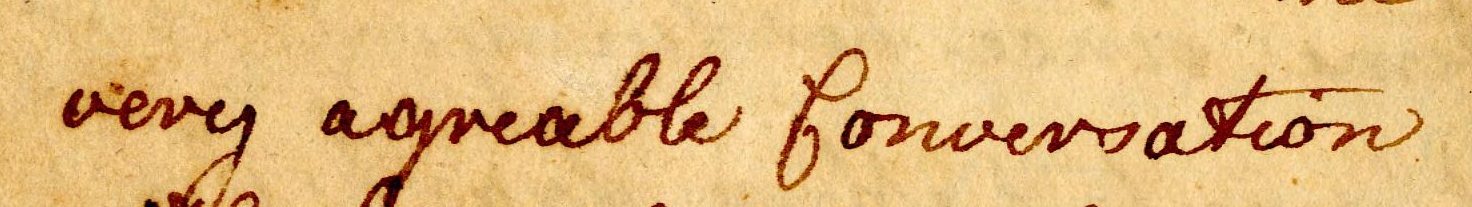very agreable Conversation
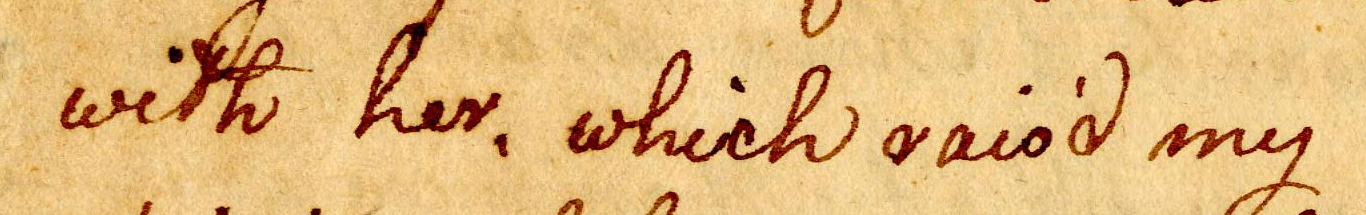with her, which rais'd my
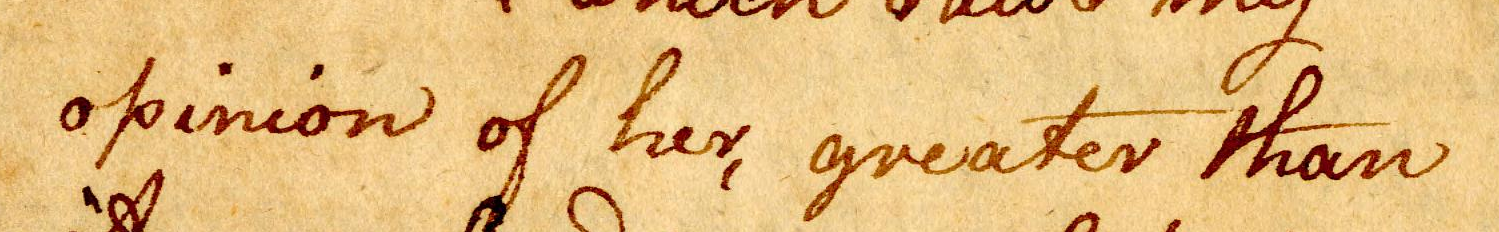opinion of her, greater than
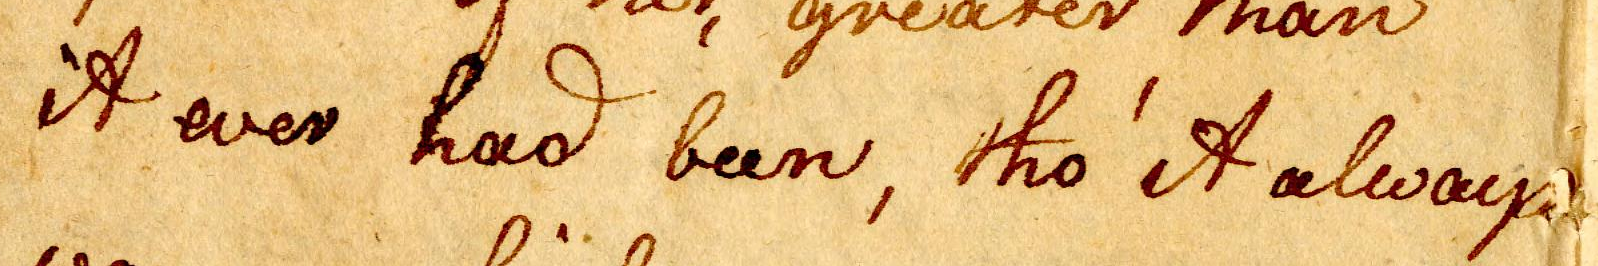it ever had been, tho' it always
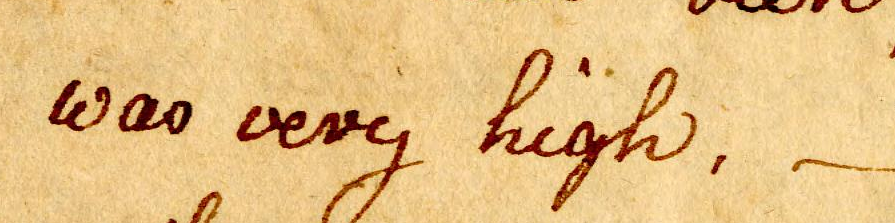was very high.-
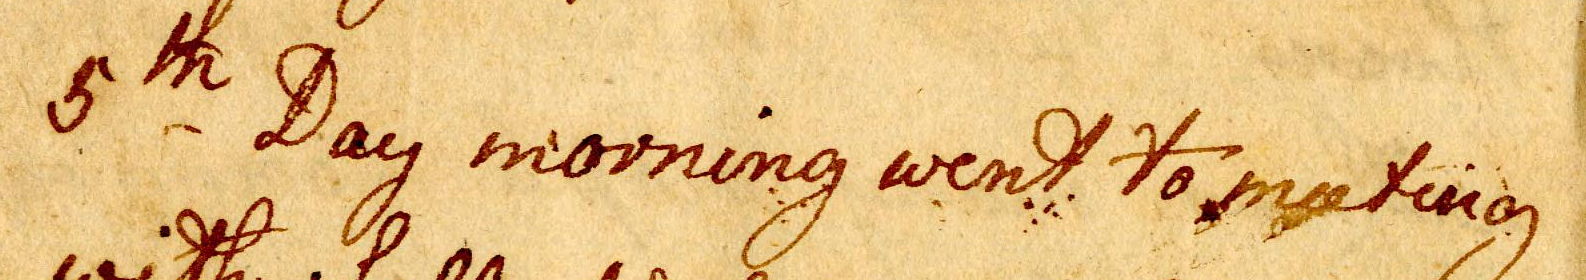5^th Day morning went to meeting
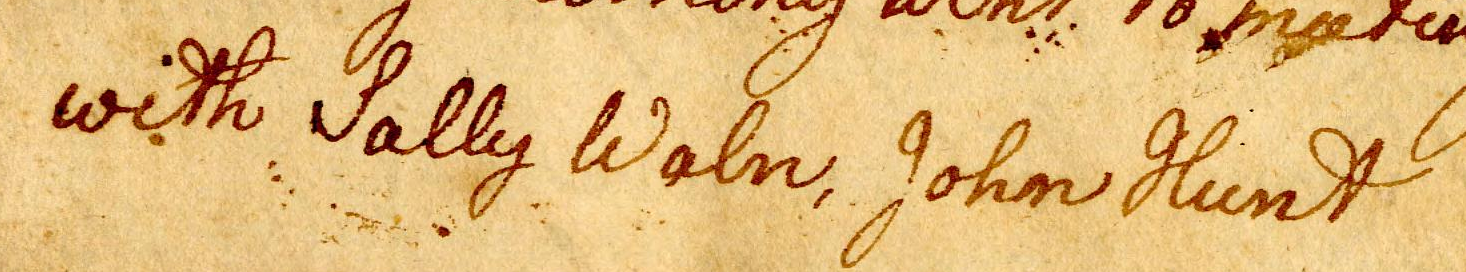with Sally Waln, John Hunt
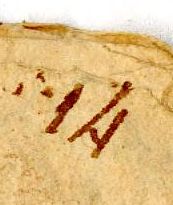14
